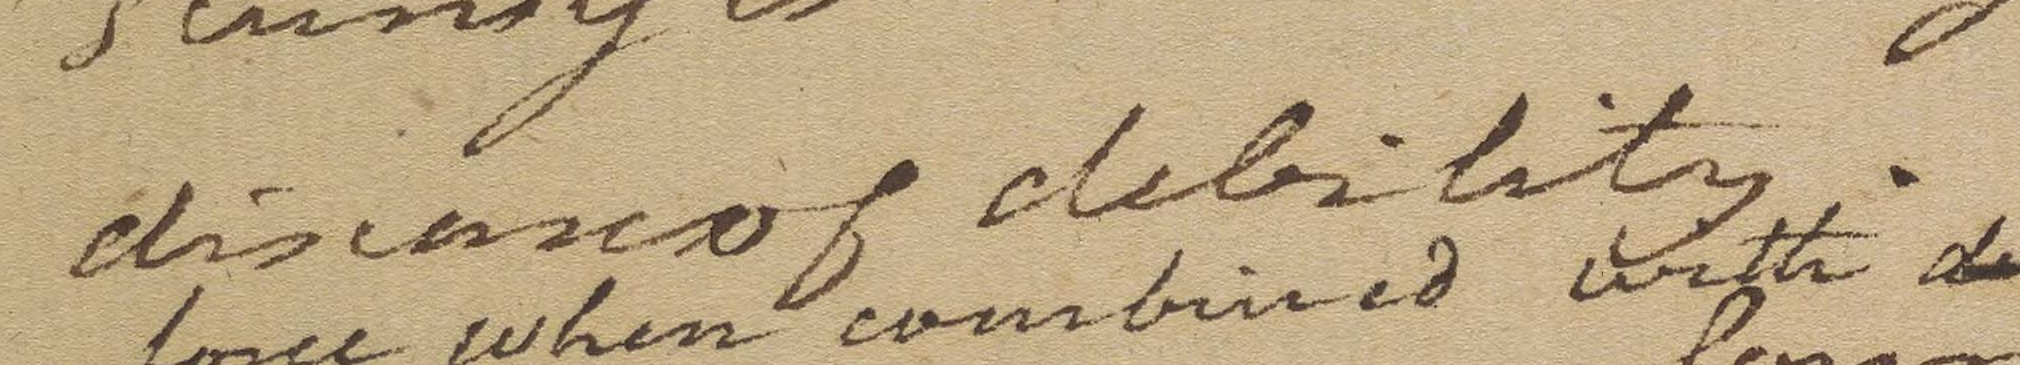disease of debility.
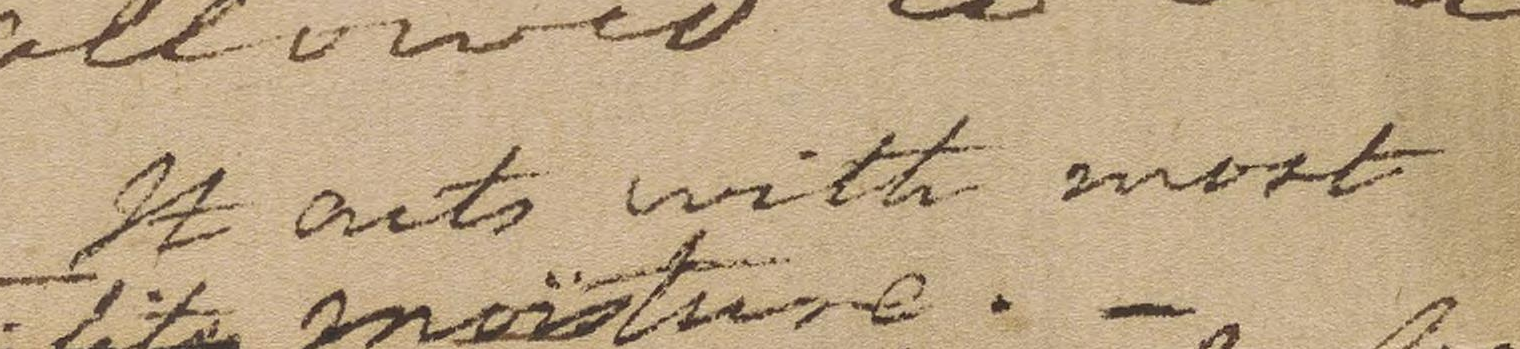It acts with most
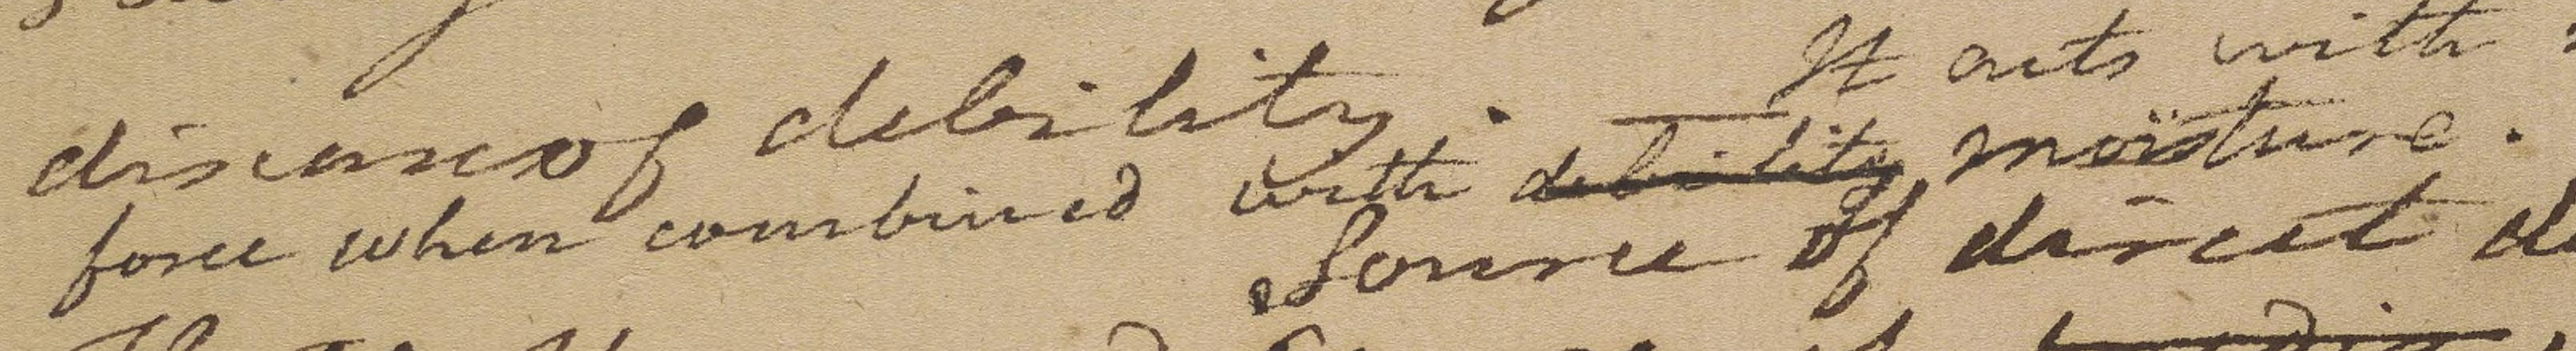force when courbined with [debility] moisture.
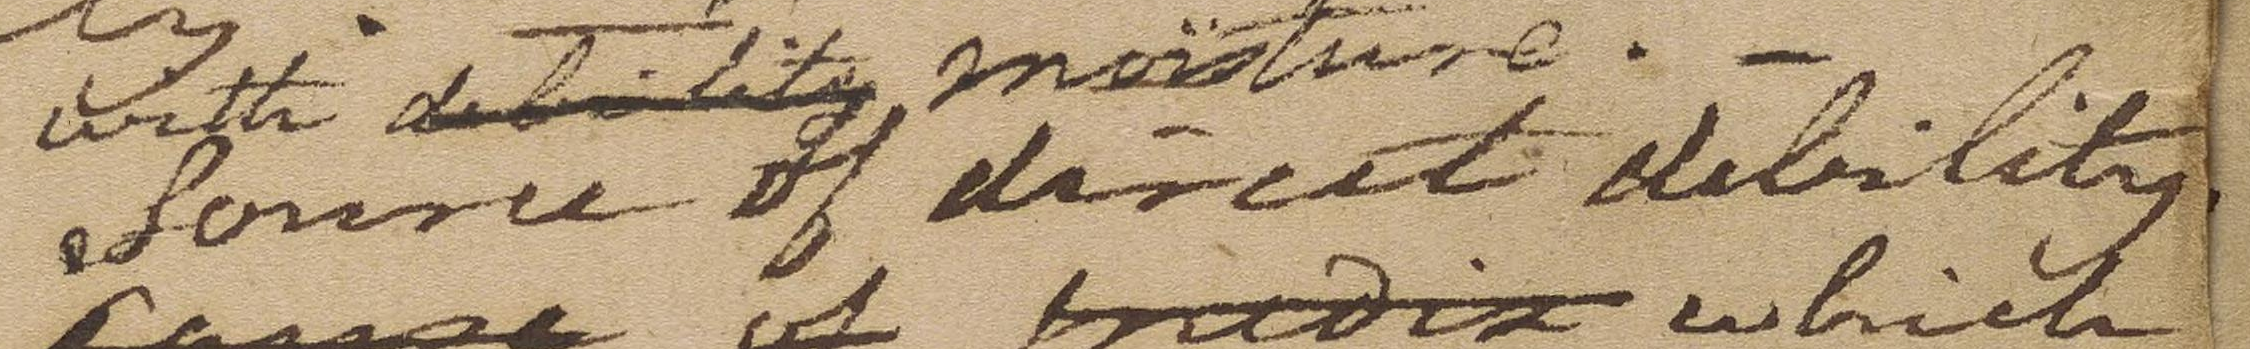source of direct debility
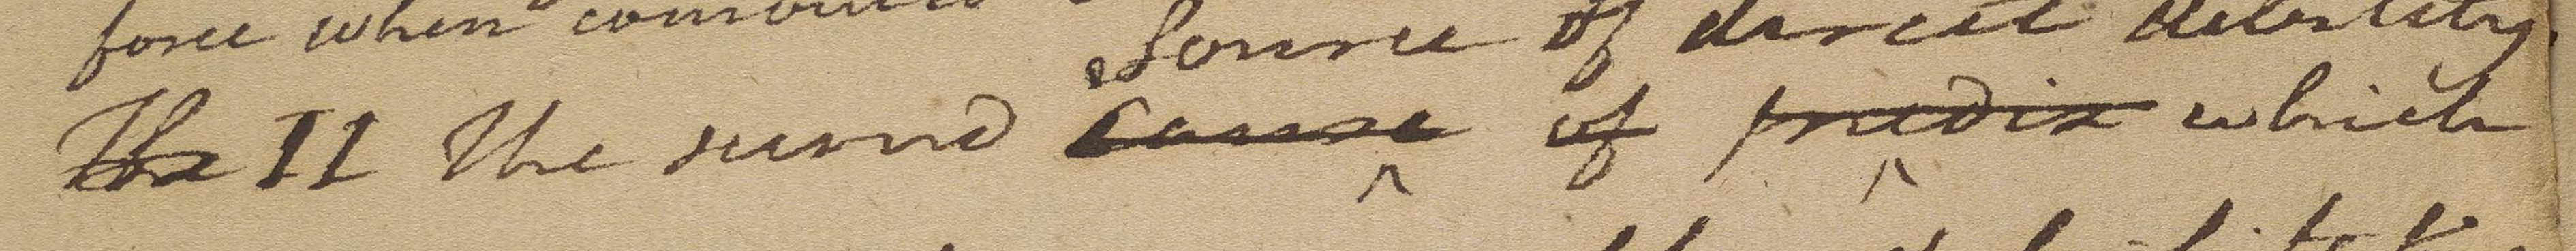[The] II The same [cause] [of] [predis] which
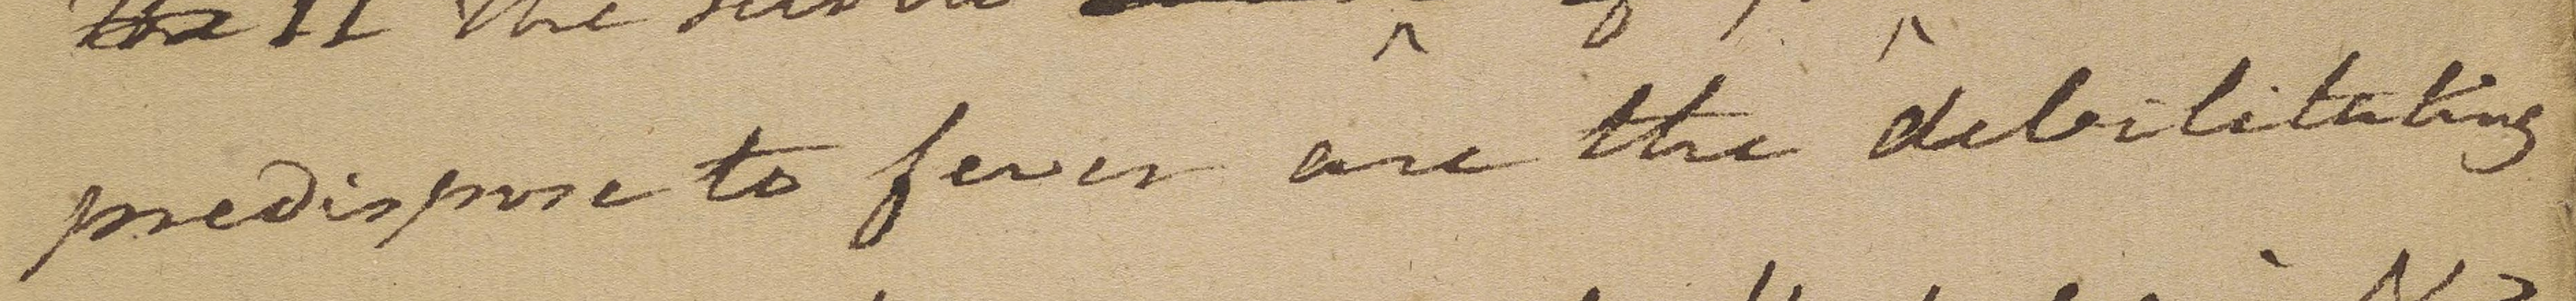predispose to fever are the debilitating
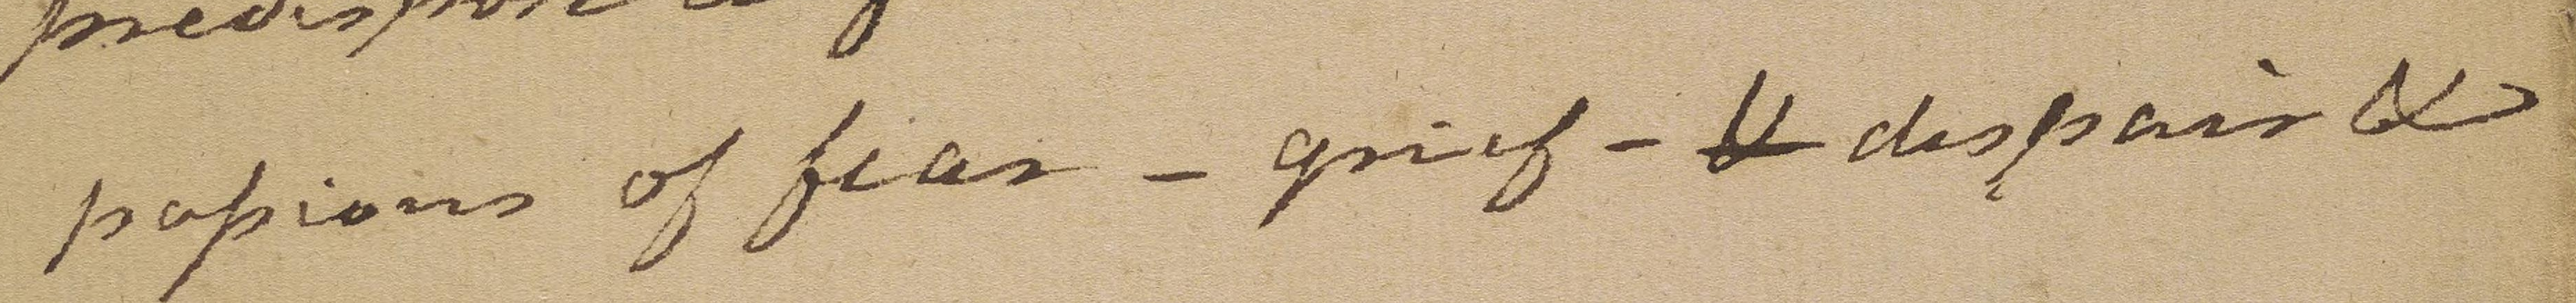passions of fear- grief- [&] despair &
